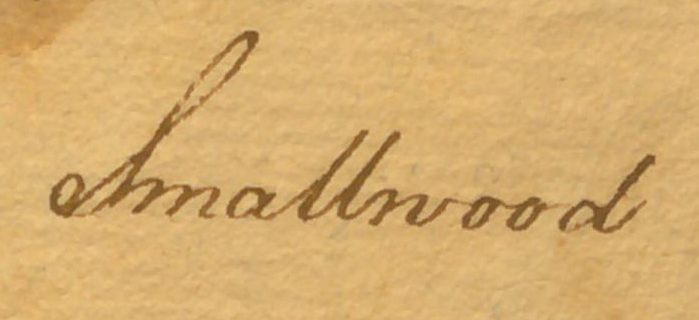Smallwood
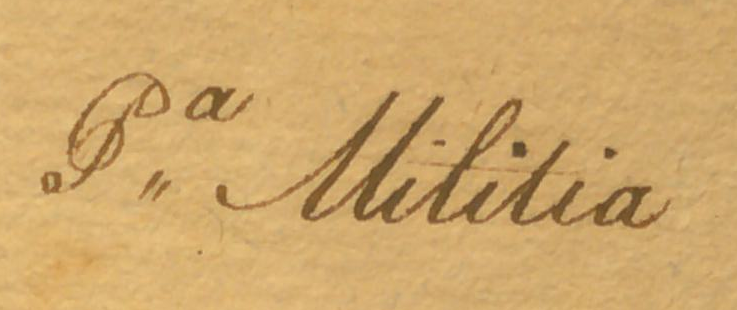P^a. Militia
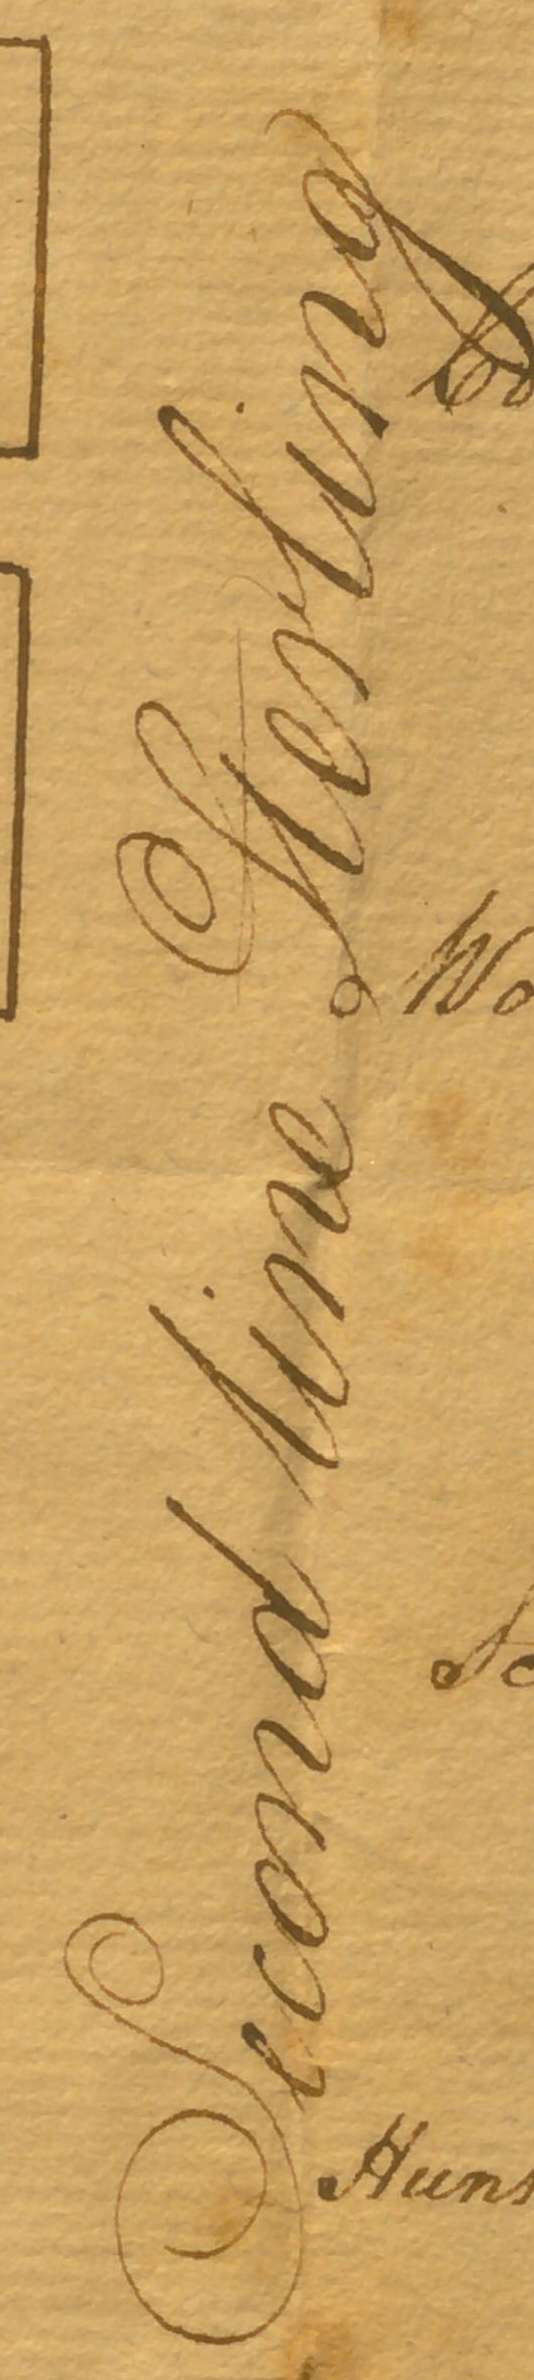Second line Sterling
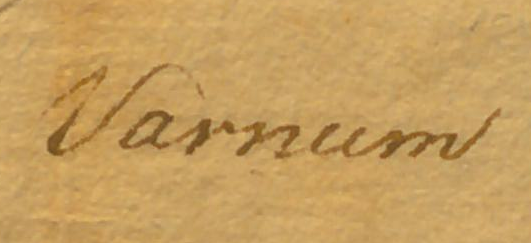Varnum
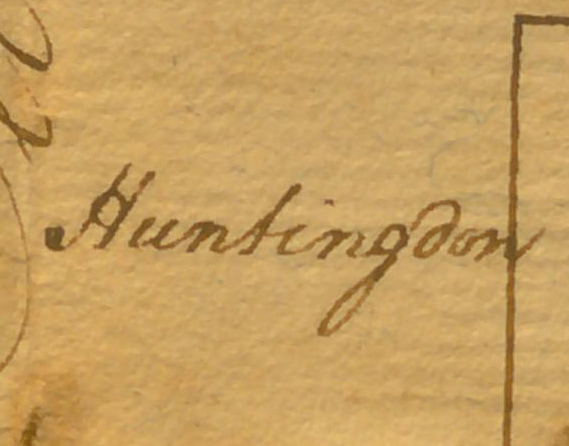Huntingdon
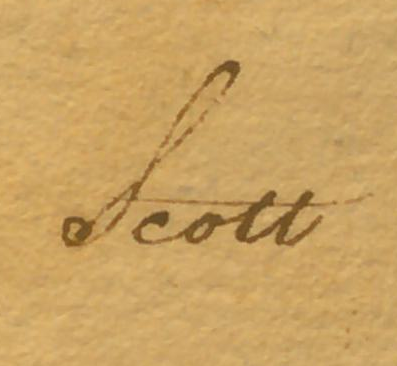Scott
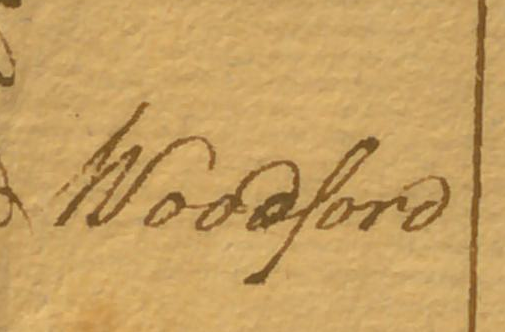Woodford
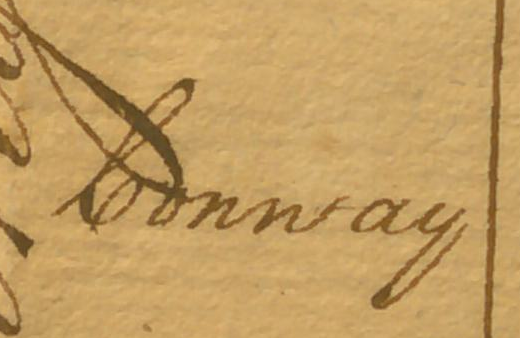Conway
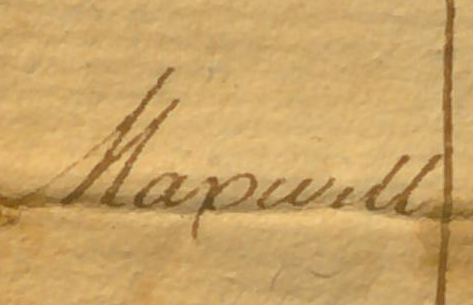Maxwell
